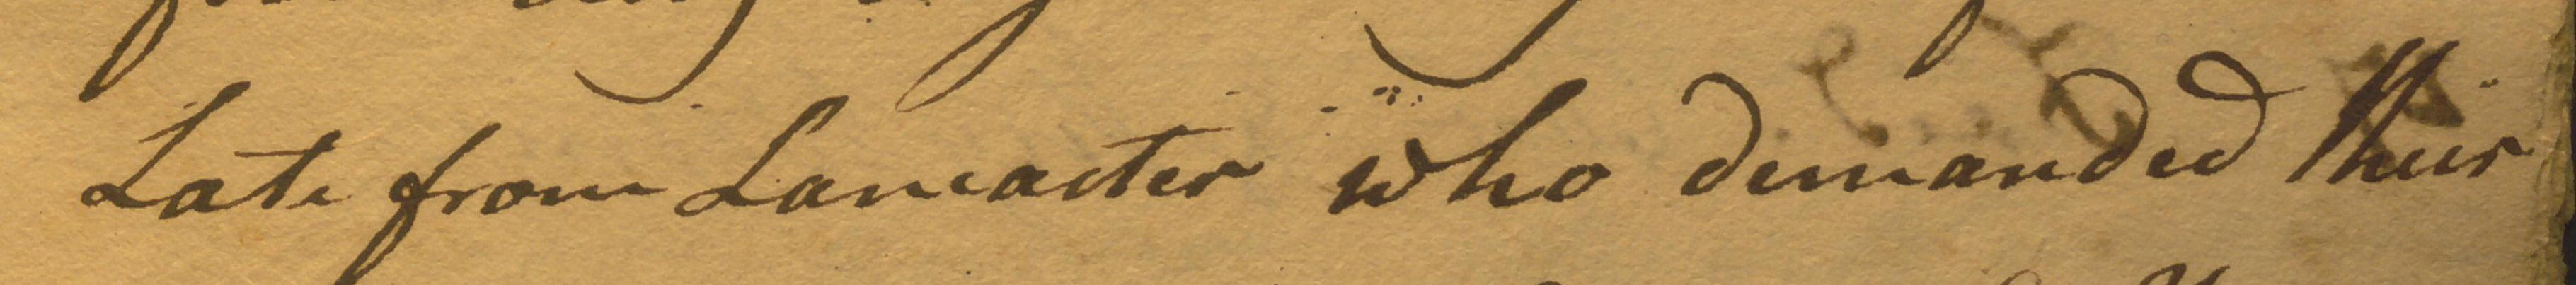Late from Lancaster who demanded their
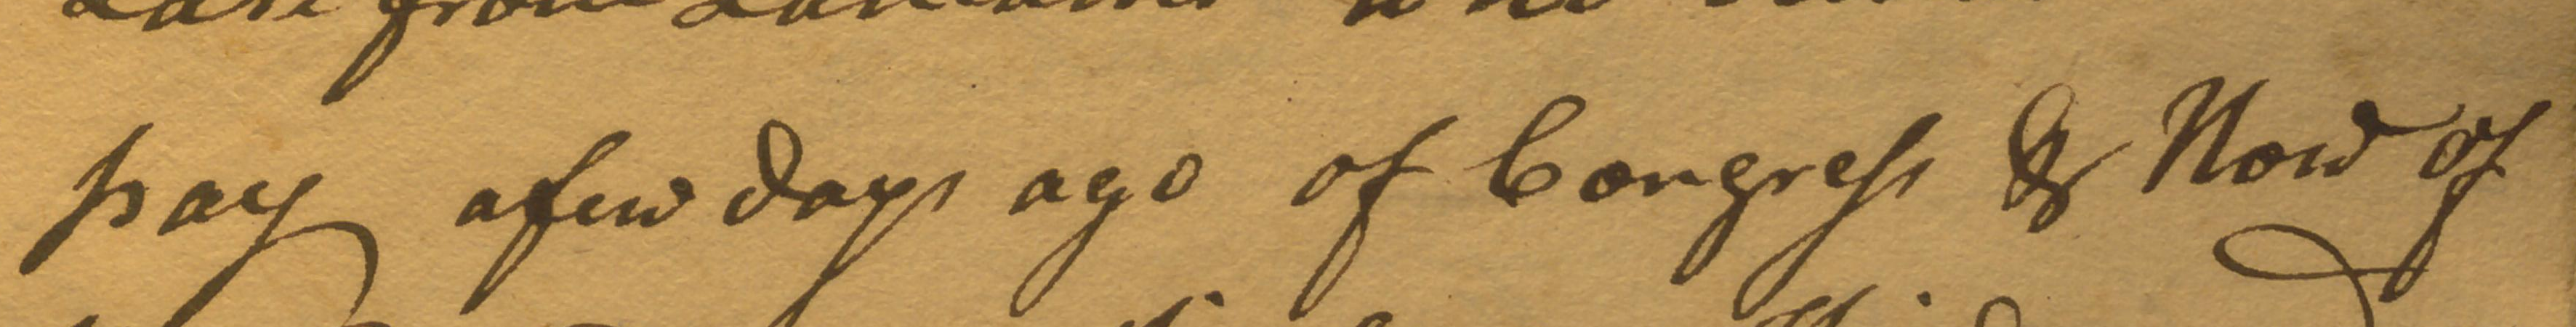pay a few days ago of Congress & Now of
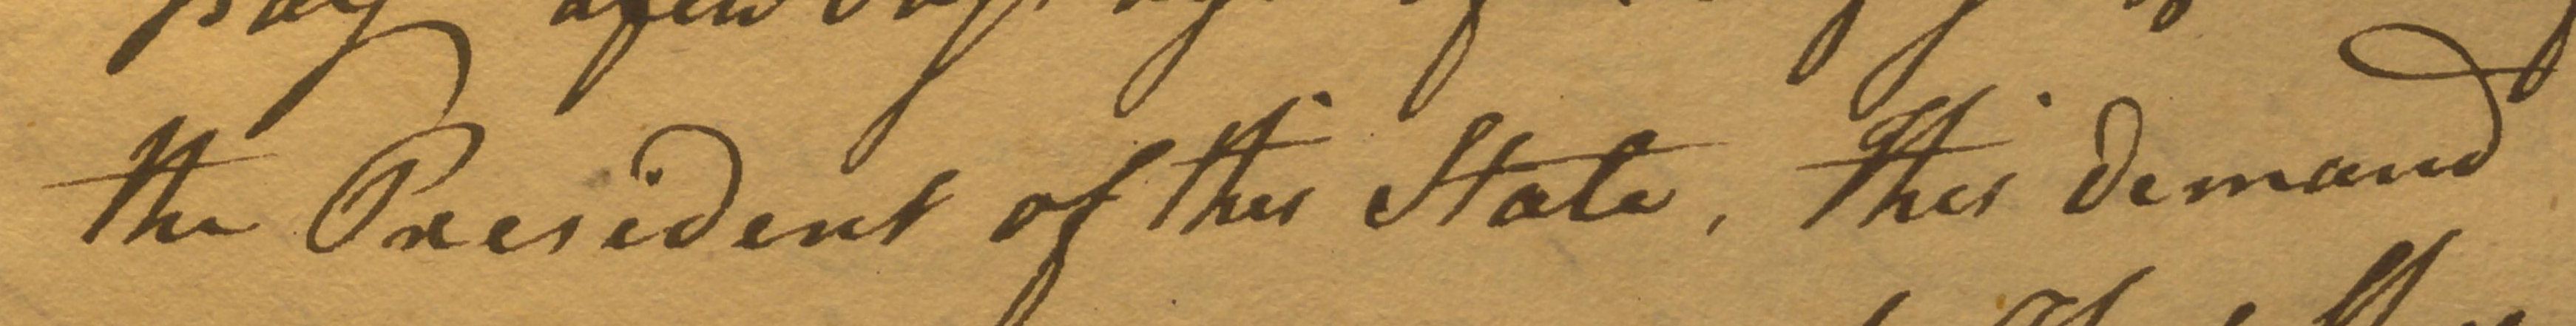the President of this State, this demand
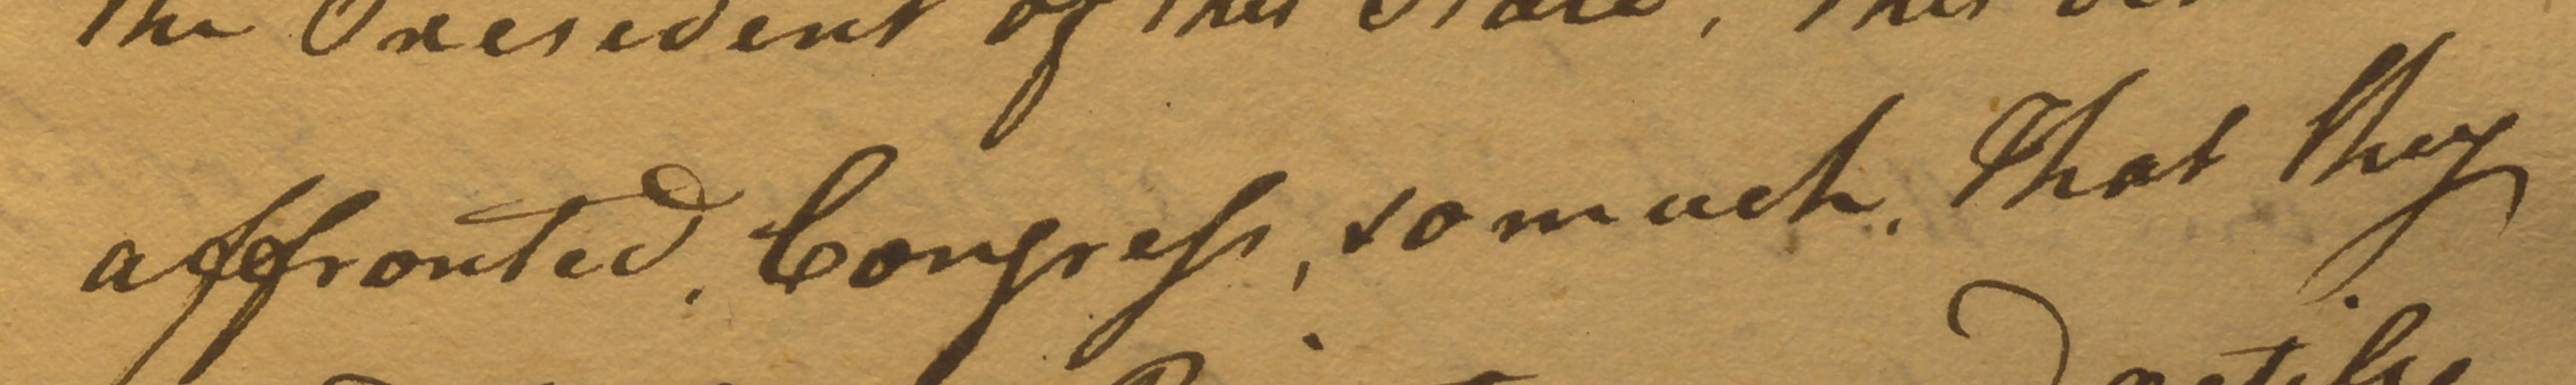affronted Congress so much that they
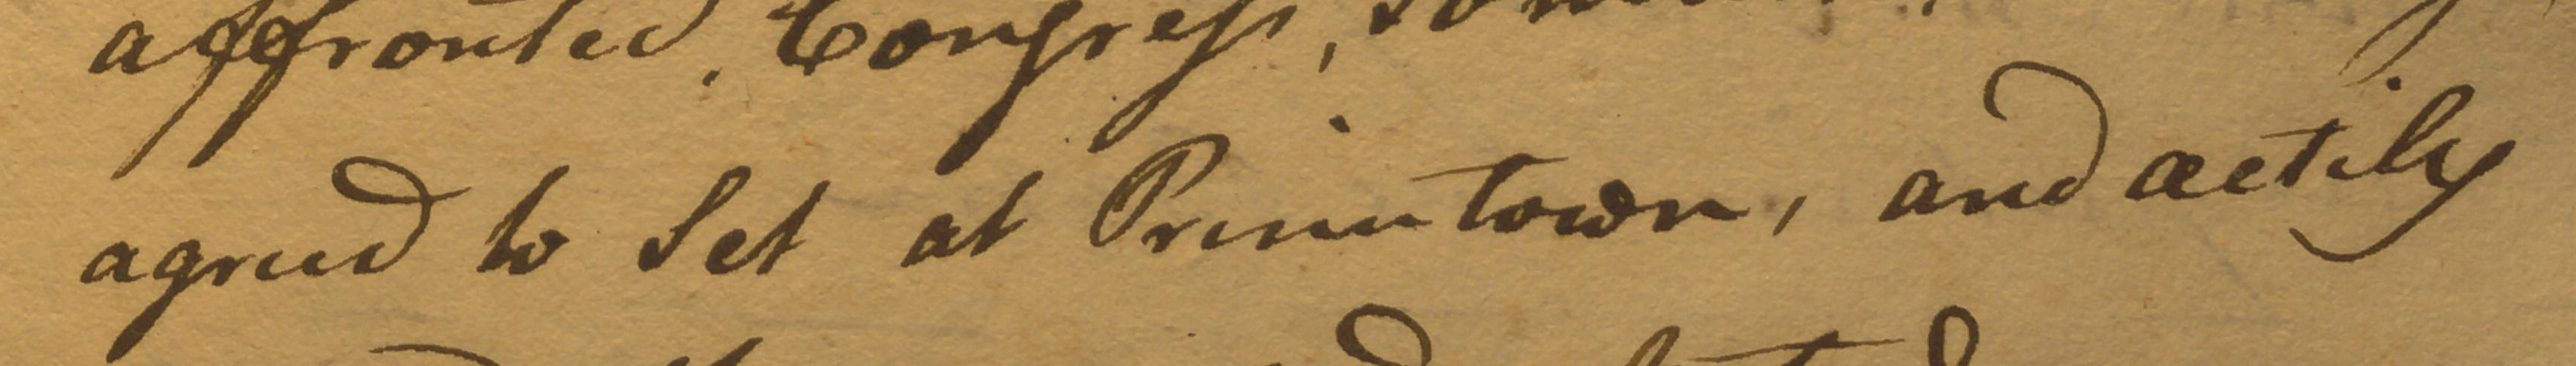agreed to set at Princetown, and actily
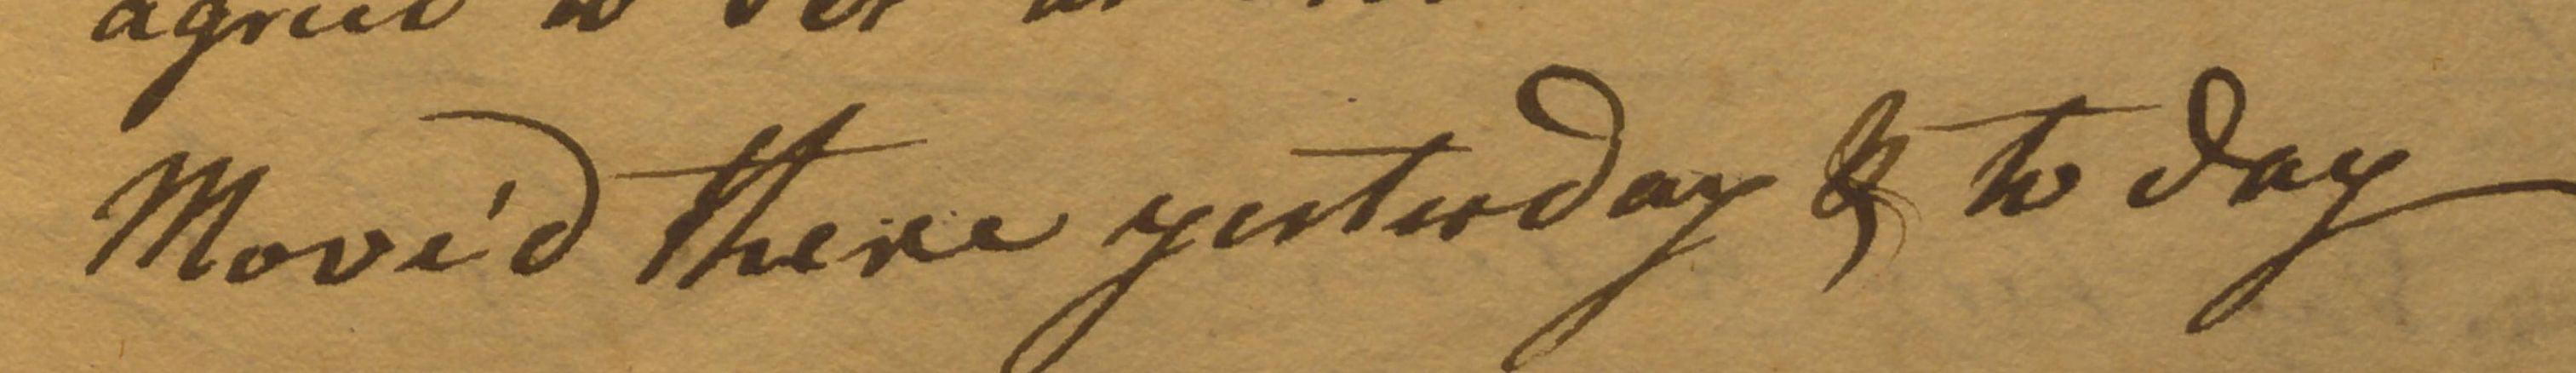Move'd there yesterday & to day
